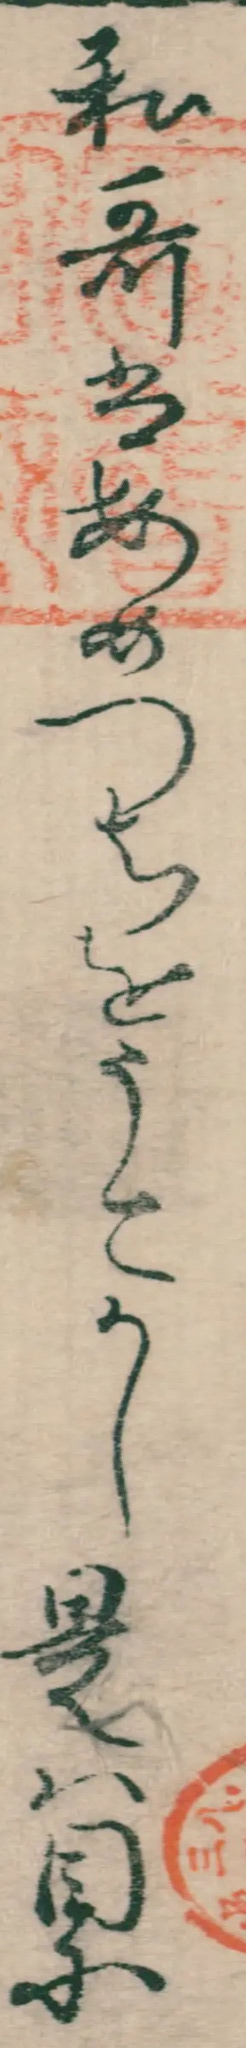和歌はあめつちをうこかし是は目に
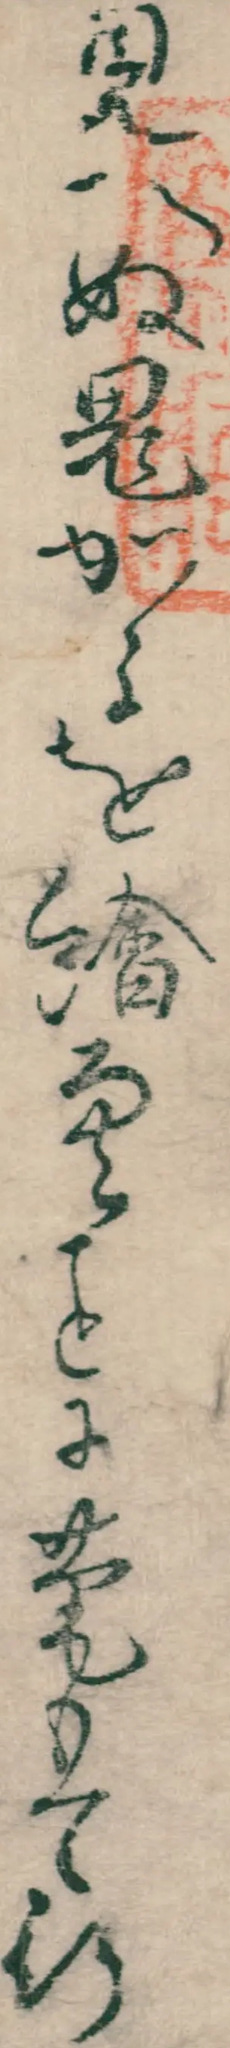見へぬ鬼かみを絵空ことに筆もて行
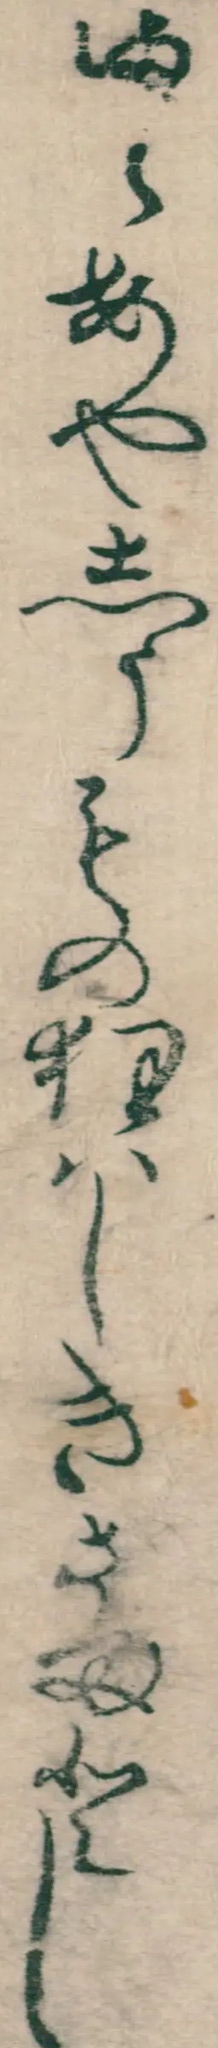まゝあやしうもの狂はしきさまとし
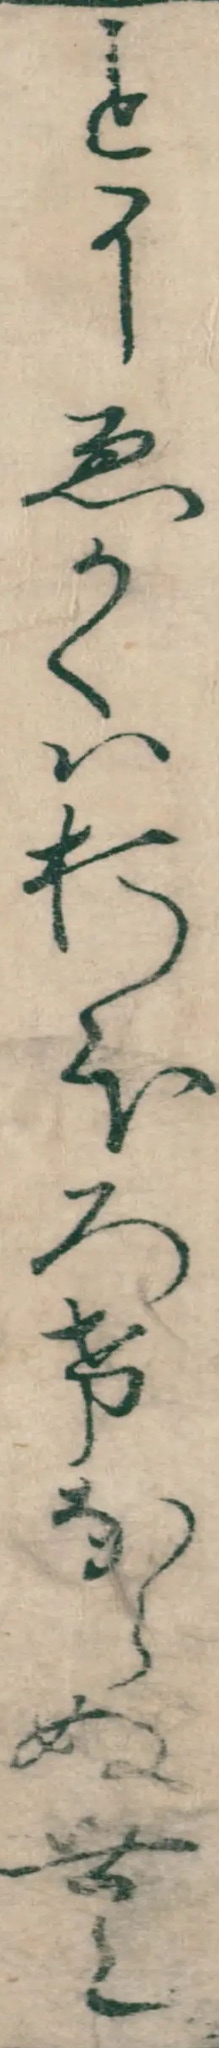ことにゑかくはおほろけならぬ世上
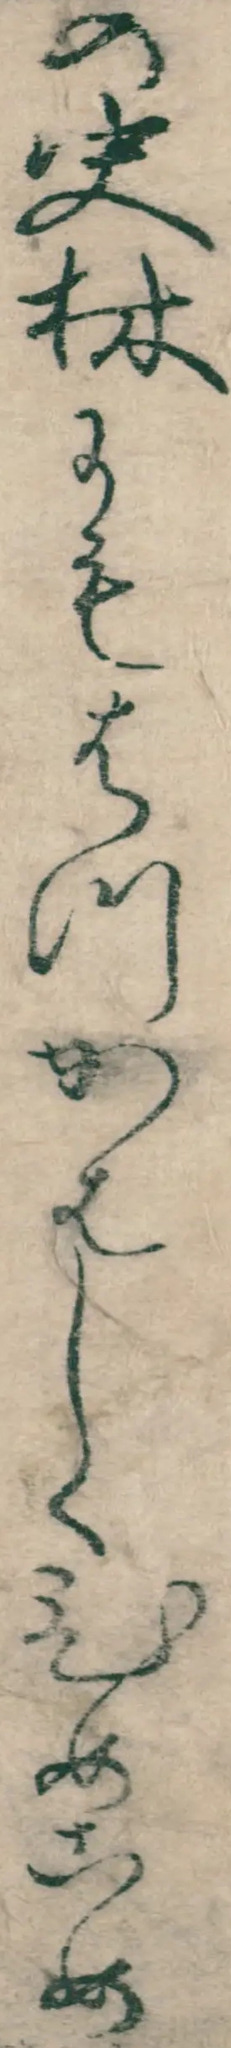の史林にもはつかはしくひめこめ

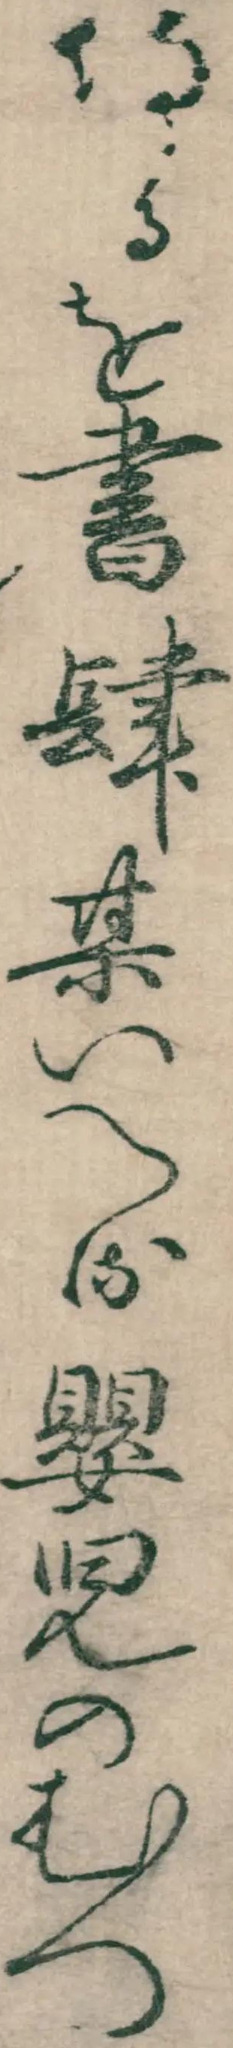侍るを書肆某いへる嬰児のむつ
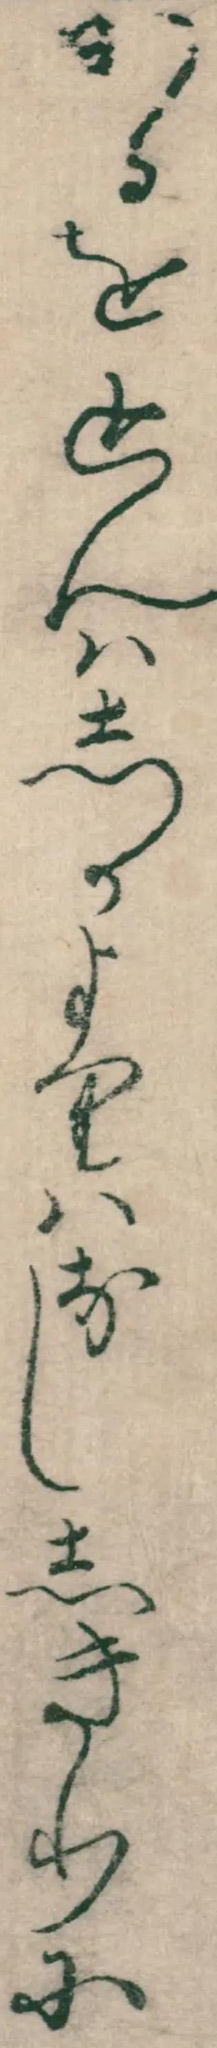かるを止んはしかよりはなししきりに
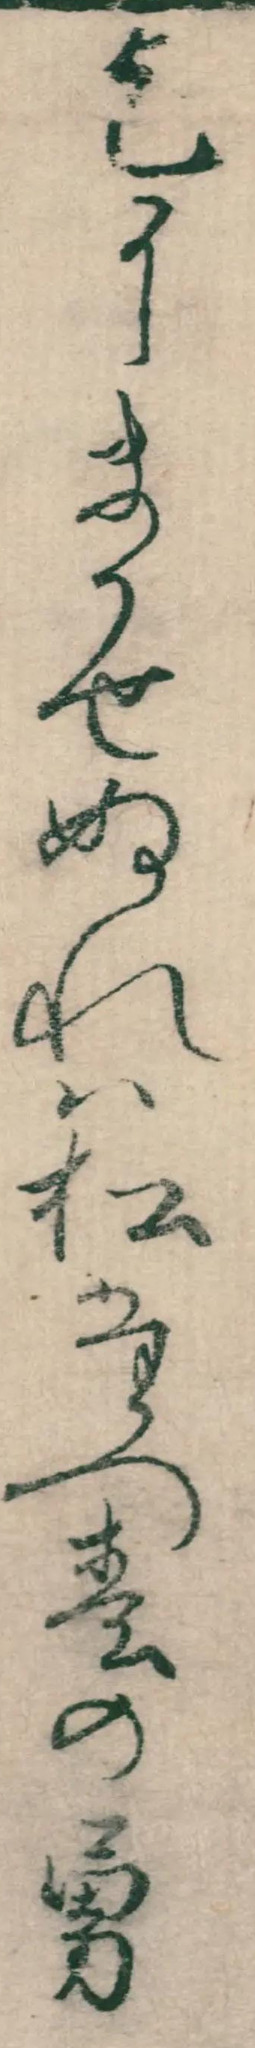乞にまかせぬれは松たつ春の勇
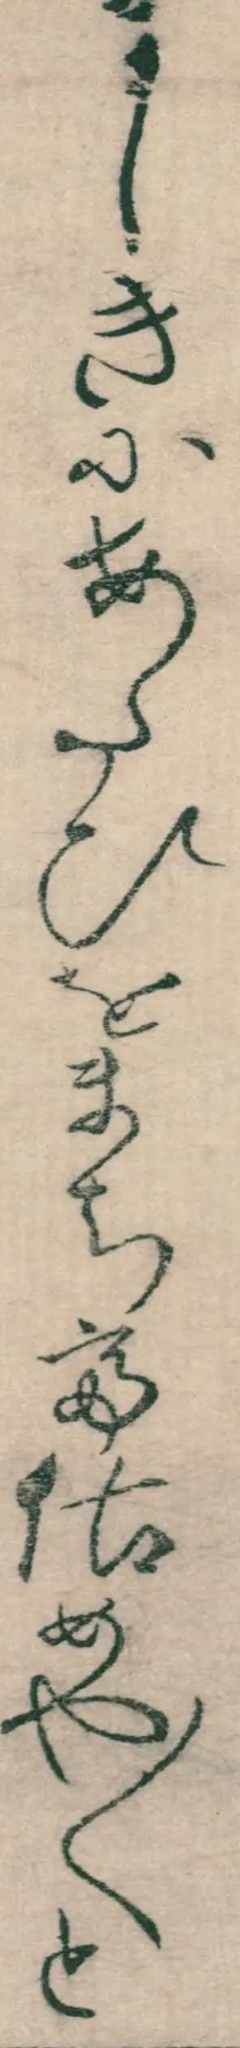ましきにあたひをまちて怙めや〳〵と
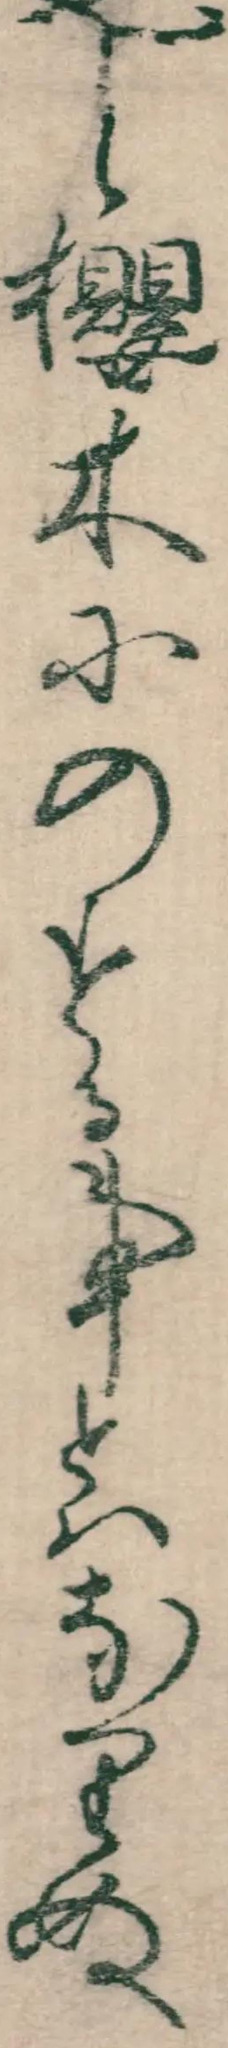やら桜木にのする事とはなりぬ
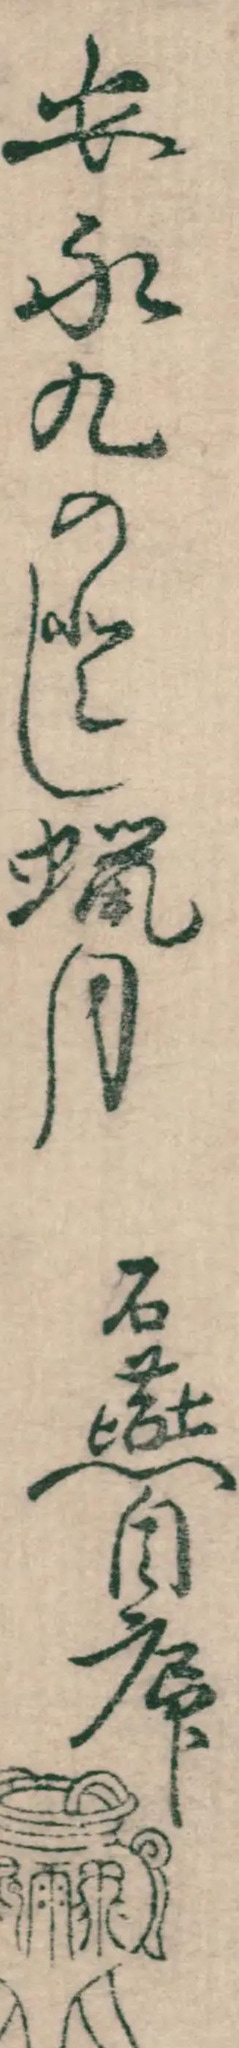安永九のとし蝋月石燕自序
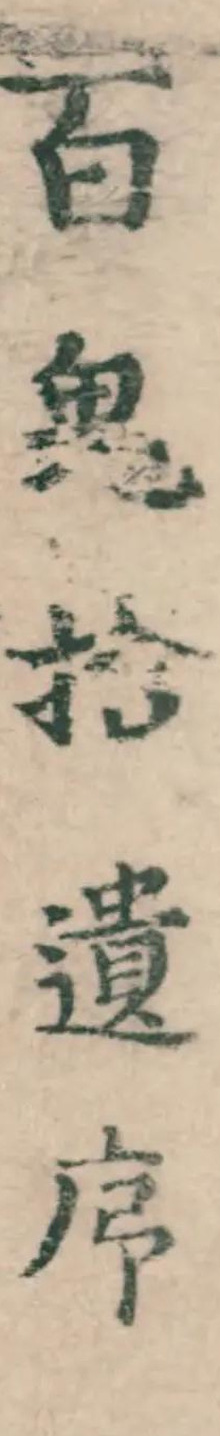百鬼拾遺序

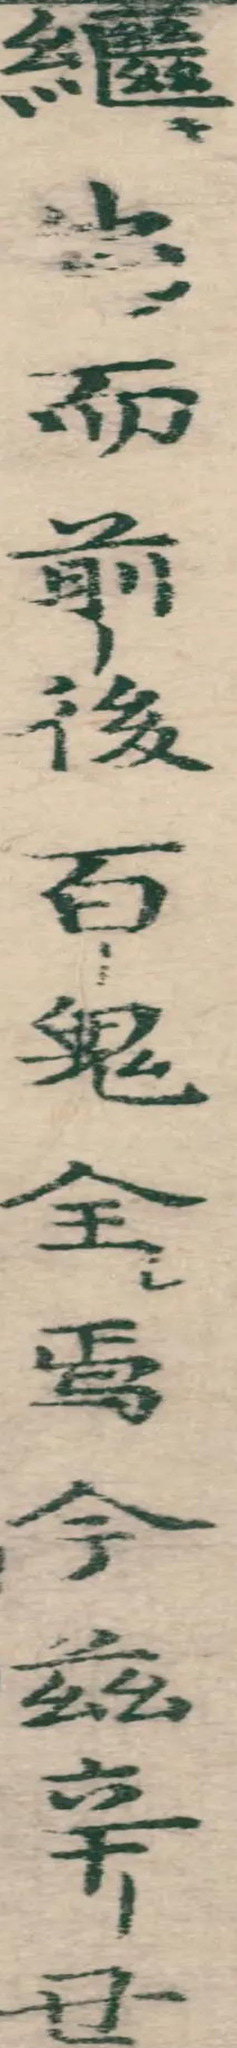継出而前-後百-鬼全焉今茲辛-丑

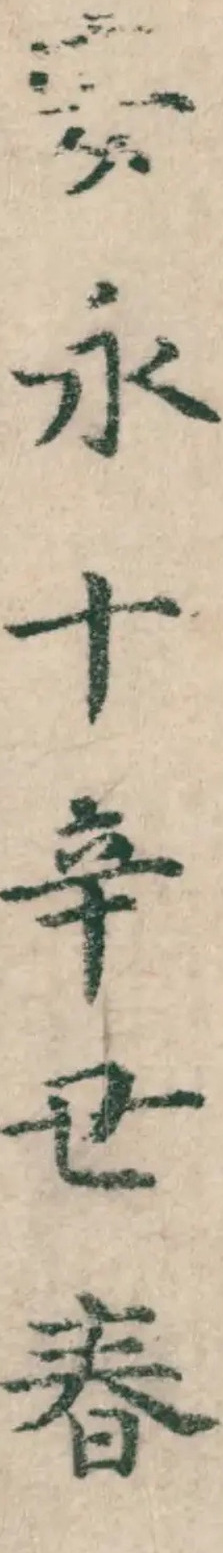安永十辛丑春
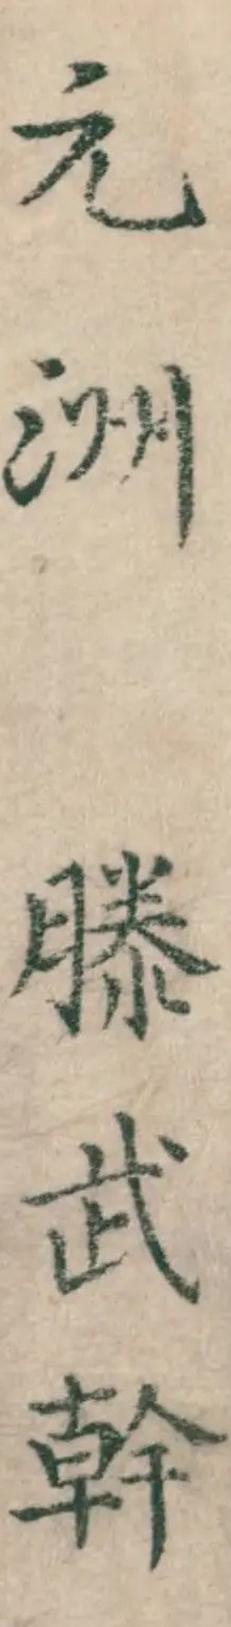元洲滕武幹
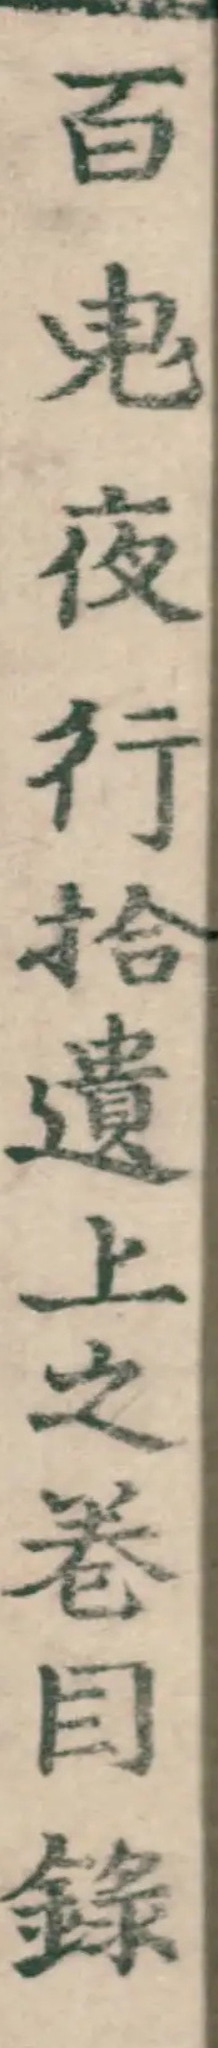百鬼夜行拾遺上之巻目録
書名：百鬼夜行 3巻拾遺3巻. [2]
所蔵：国立国会図書館 National Diet Library, JAPAN
